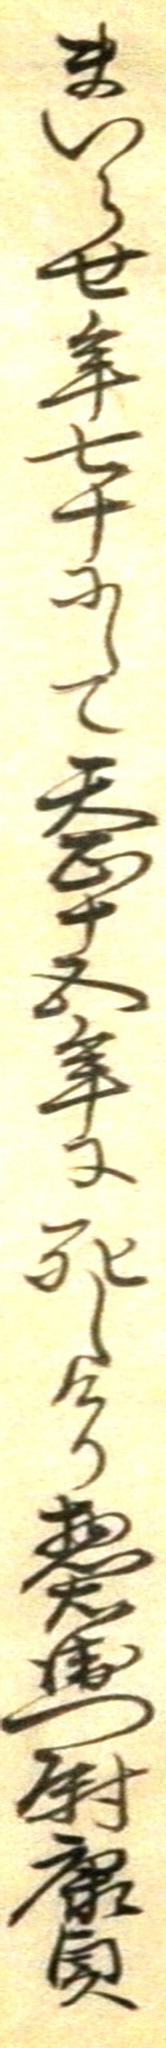まいらせ年七十にして天正十五年に死しけり惣右衛門尉康貞
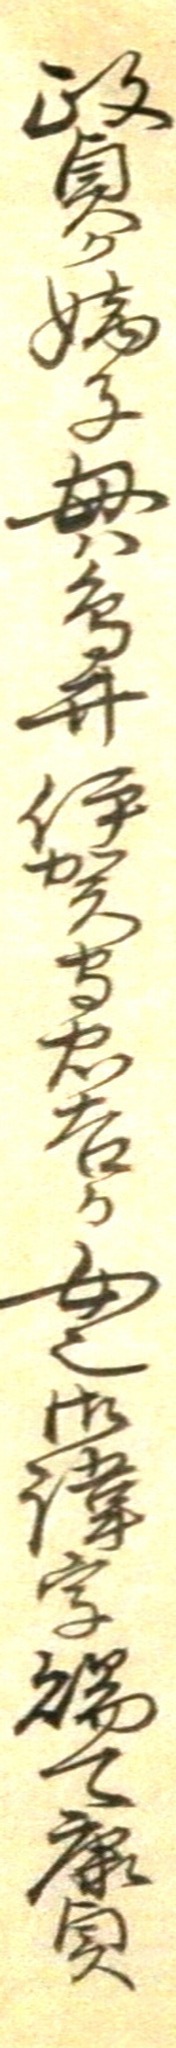政貞か嫡子母は鳥井伊賀守忠吉か女也御諱字賜て康貞
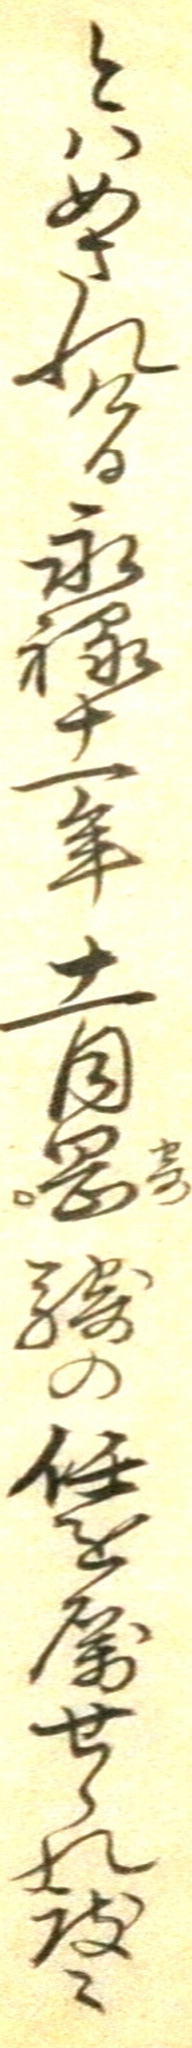とはめされける永禄十一年十一月岡騎の任を属せられ度々
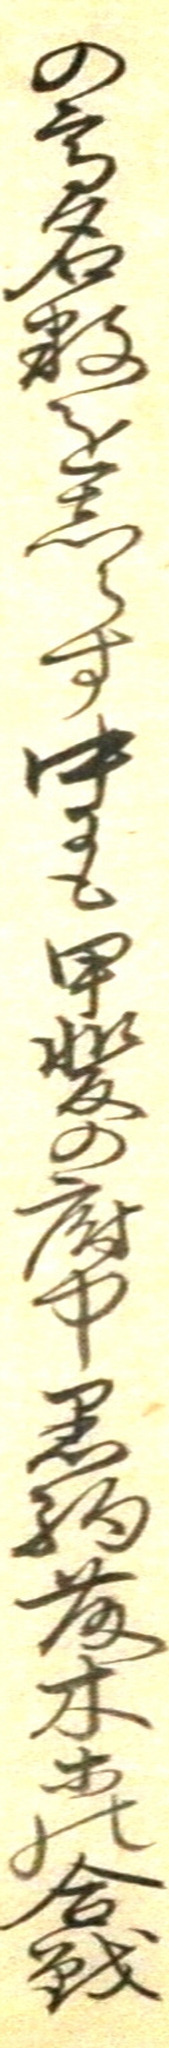の高名数をしらす中にも甲斐の府中黒駒藤木等の合戦
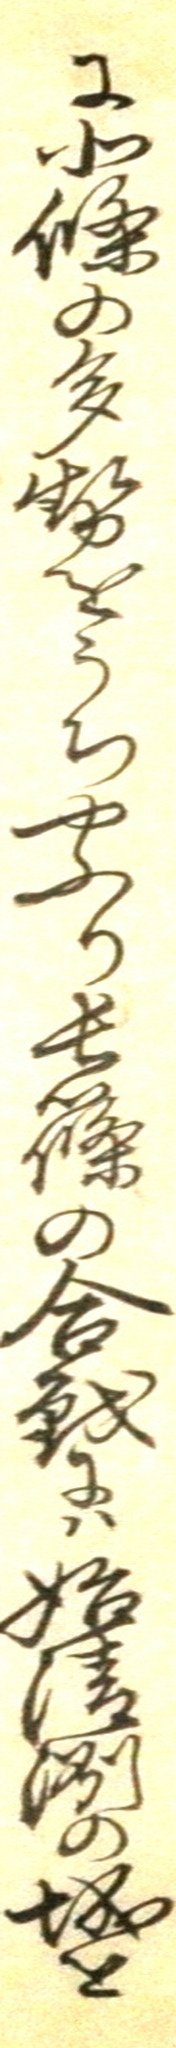に北条の多勢をうちやふり長篠の合戦には始清洲の城を
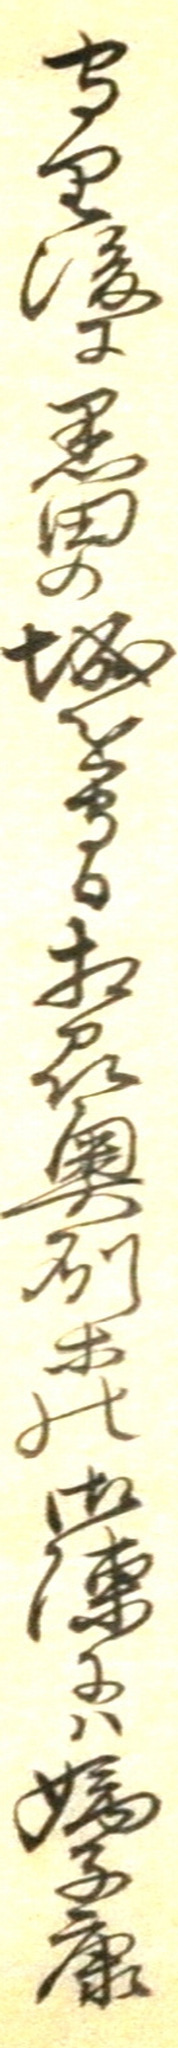守り後に黒田の城を守る相州奥州等の御陣には嫡子康
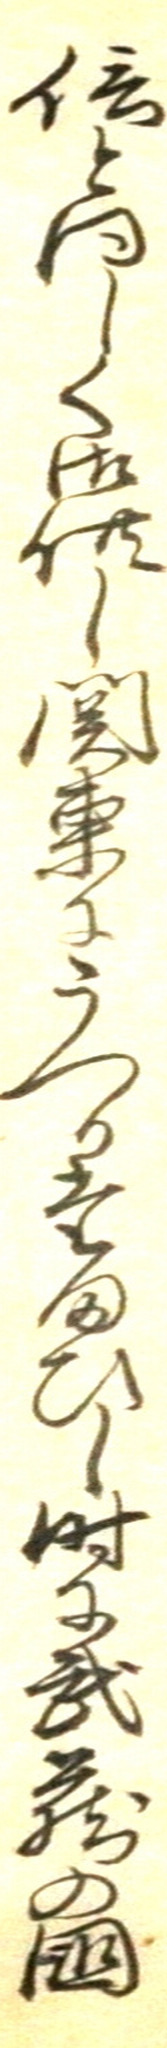信と同しく御供し関東にうつりすまひし時に武蔵の国
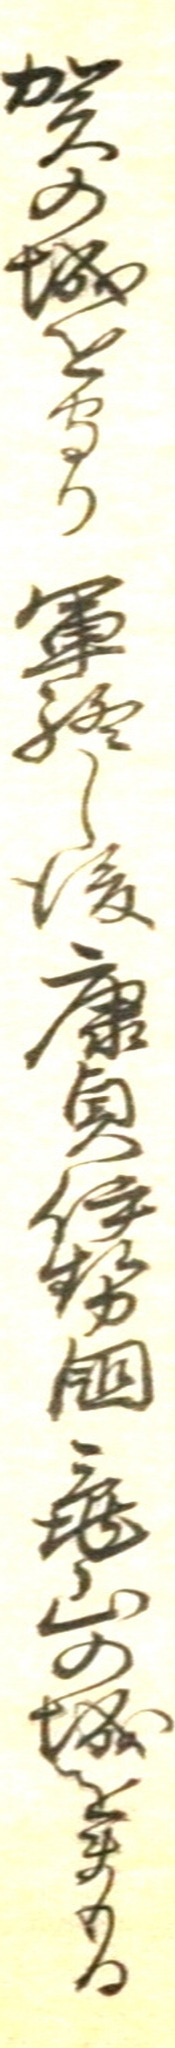賀の城を守り軍終し後康貞伊勢国亀山の城をまもる
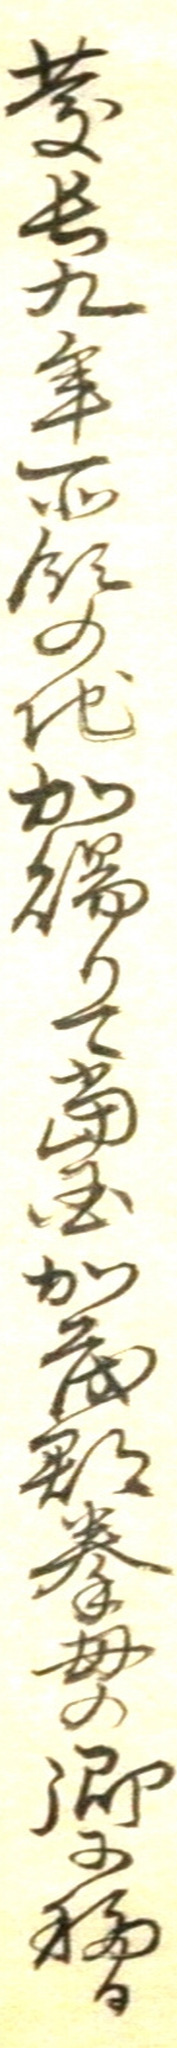慶長九年所領の地加賜りて当国加茂郡拳母の郷に移る
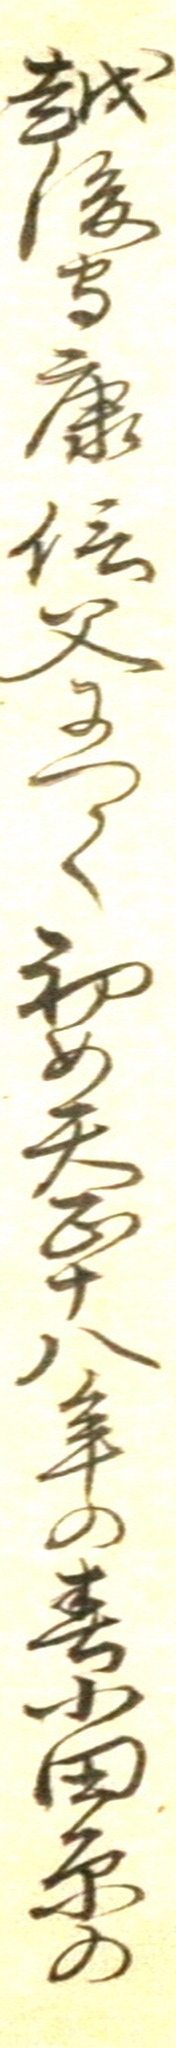越後守康信父につく初め天正十八年の春小田原の
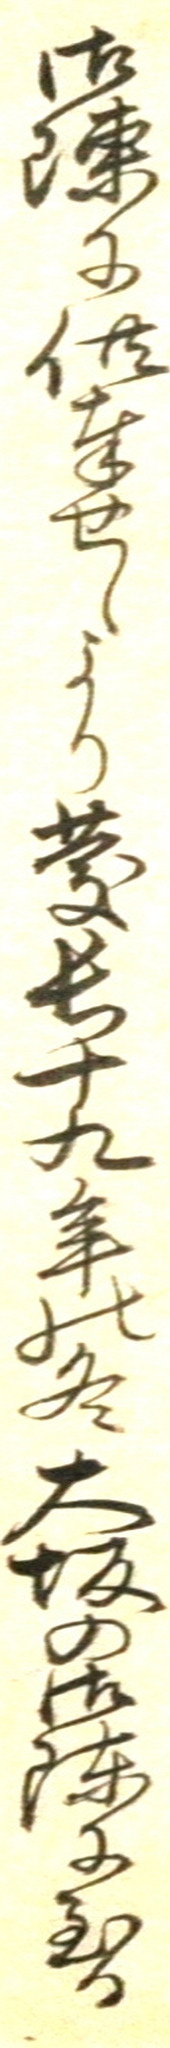御陣に供奉せしより慶長十九年の冬大坂の御陣に至る
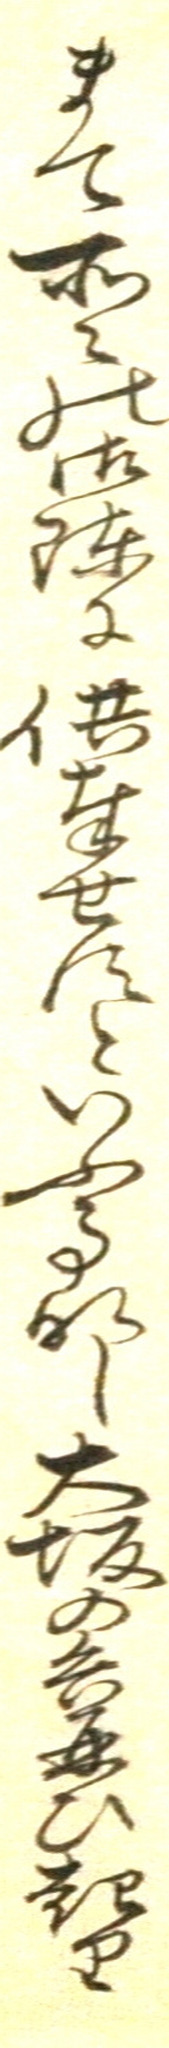まて所々の御陣に供奉せすといふ事なし大坂の兵再ひ起り
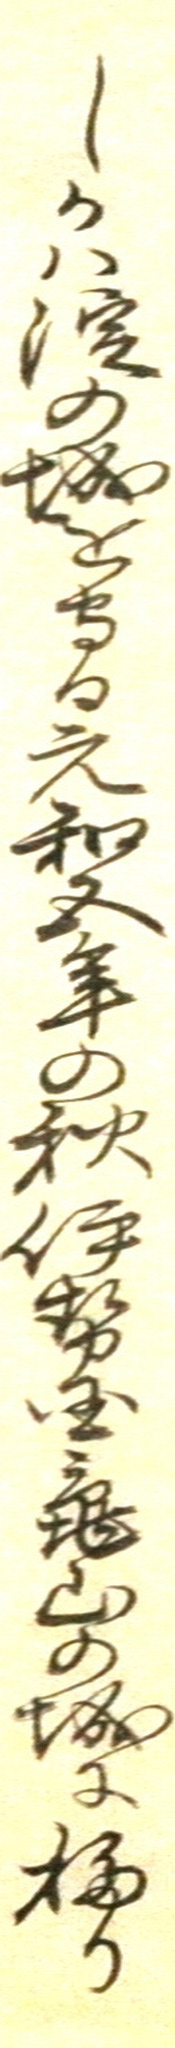しかは淀の城を守る元和五年の秋伊勢国亀山の城に移り
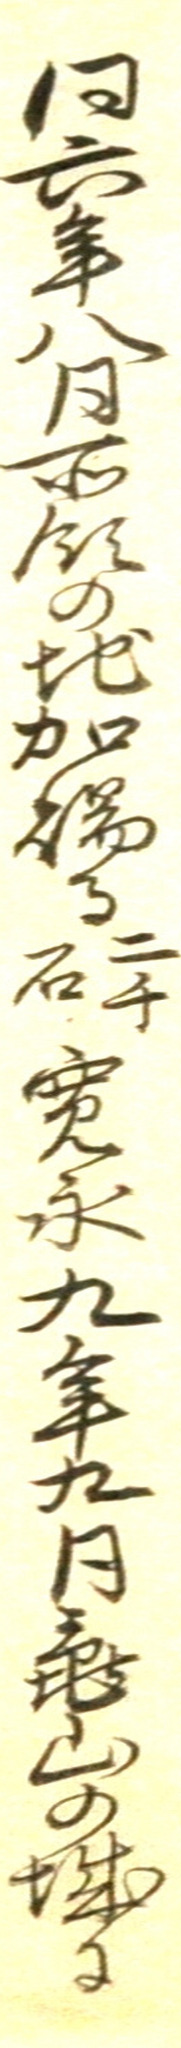同六年八月所領の地加賜る二千石寛永九年九月亀山の城に
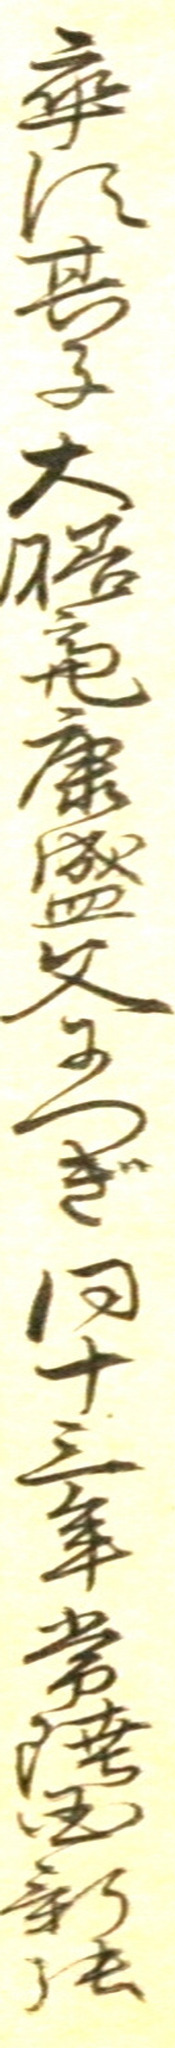卒す其子大膳亮康盛父につぎ同十三年常陸国新張

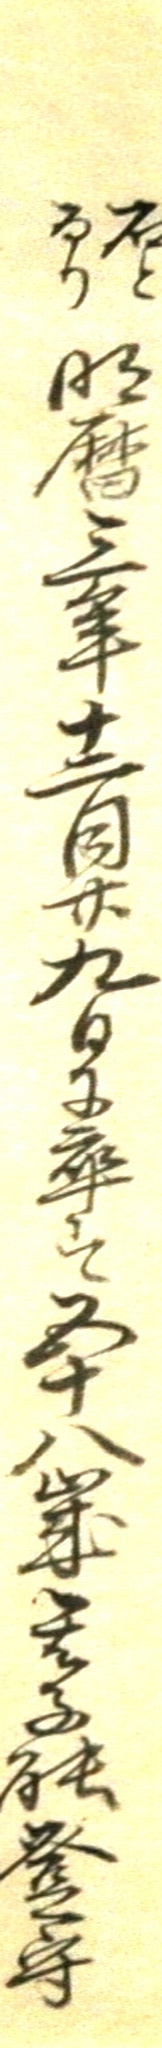石となり明暦三年十二月二十九日に卒す五十八歳其子能登守
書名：藩翰譜（四・下）
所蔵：伊那市立高遠町図書館・合同会社AMANE
